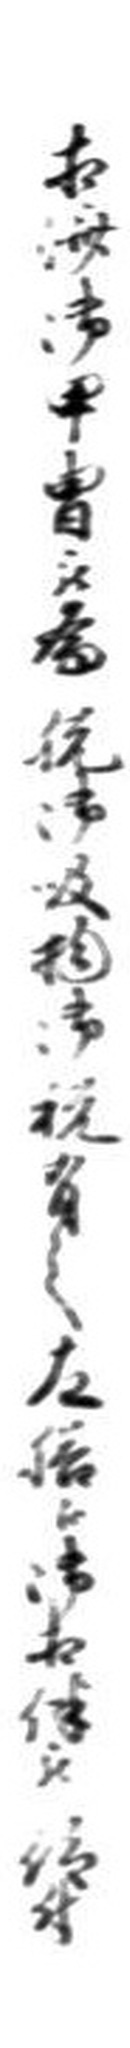相済御甲冑被為祝御吸物御祝有之左膳江御相伴被仰付
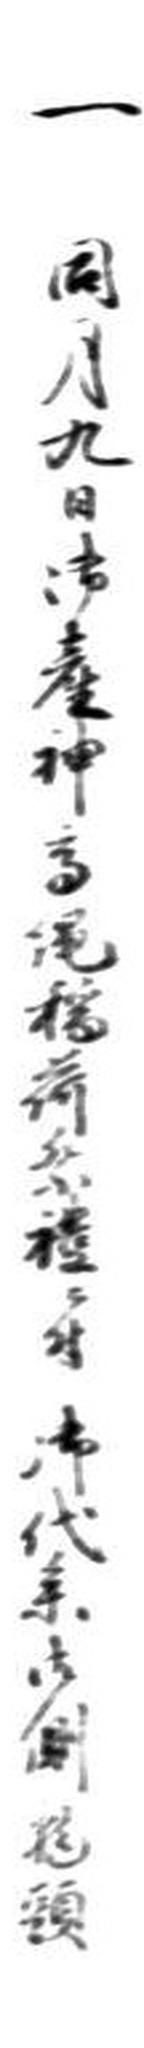一同月九日御産神高縄稲荷登礼ニ付御代参御側物頭
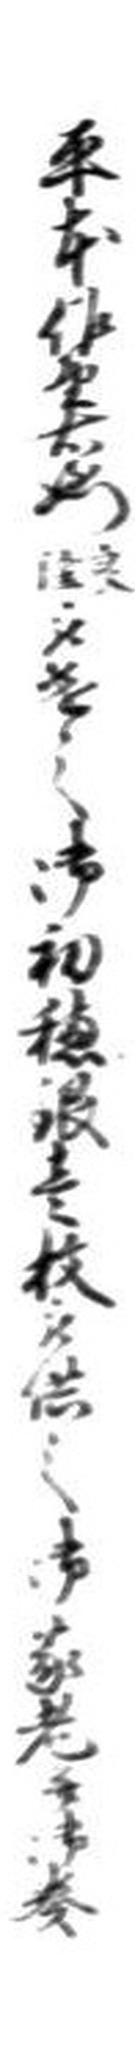平本作野右衛門良隆被遣之御初穂銀壱枚被供之御家老幷御奏
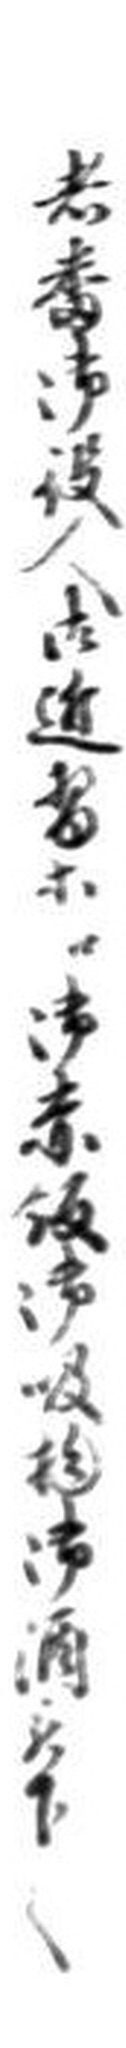者番御役人御近習等江御赤飯御吸物御酒被下之
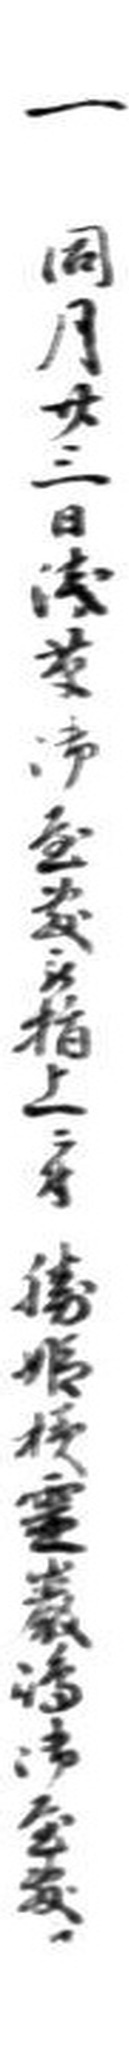一同月廿三日浅草御屋敷被指上ニ付勝姫様霊巖嶋御屋敷江
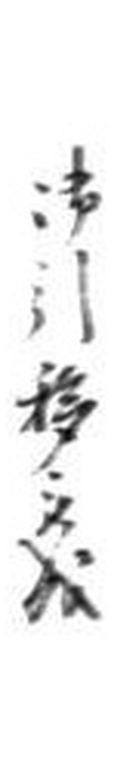御引移被成
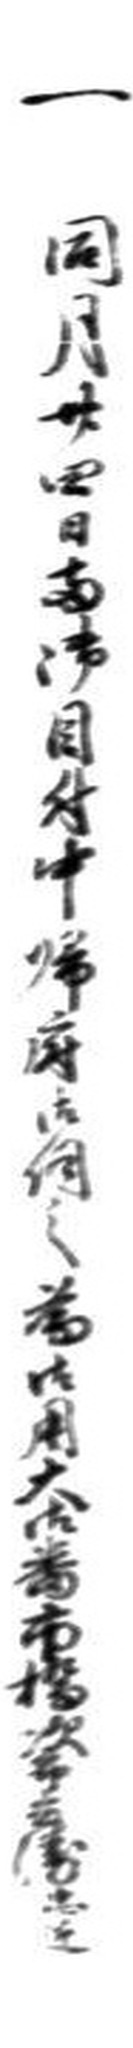一同月廿四日両御目付中帰府御伺之為御用大御番市橋次郎兵衛忠近

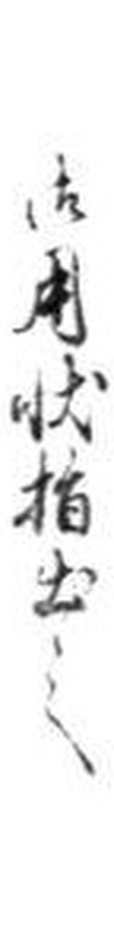御用状指出之
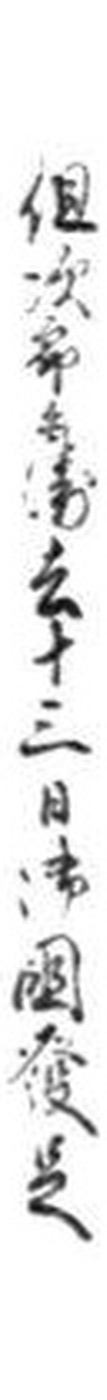但次郎兵衛去十三日御国発足
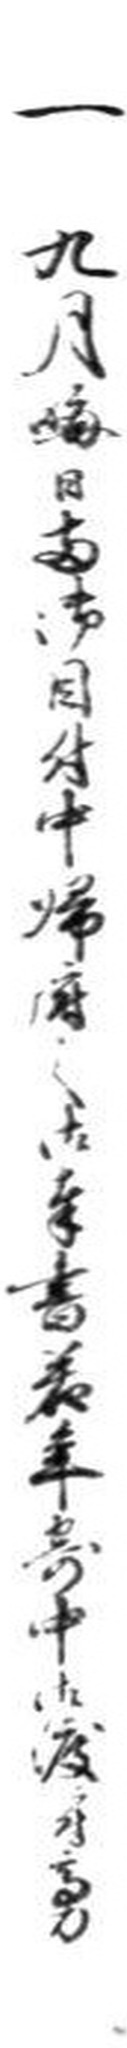一九月晦日両御目付中帰府之御奉書若年寄中御渡ニ付高力
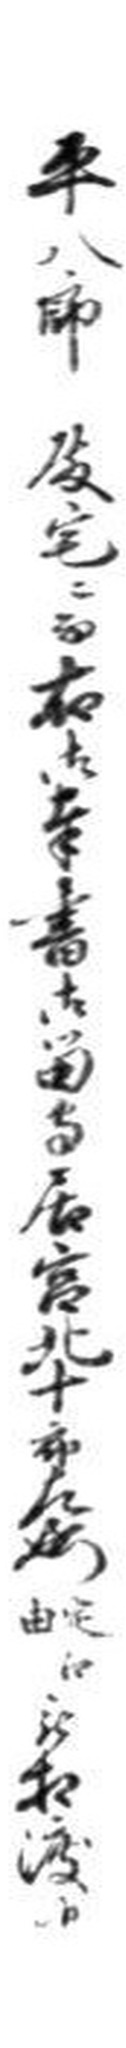平八郎殿宅ニ而右御奉書御留守居宮北十郎左衛門定由江被相渡候
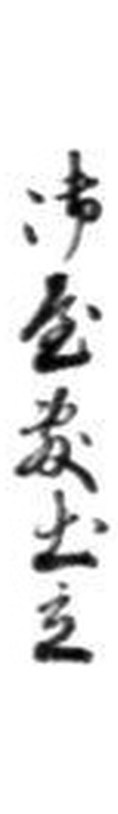御屋敷出立
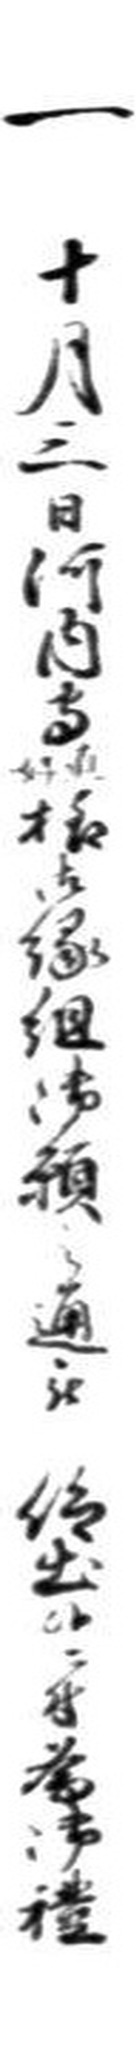一十月三日河内守直好様御縁組御願之通被仰出候ニ付為御礼
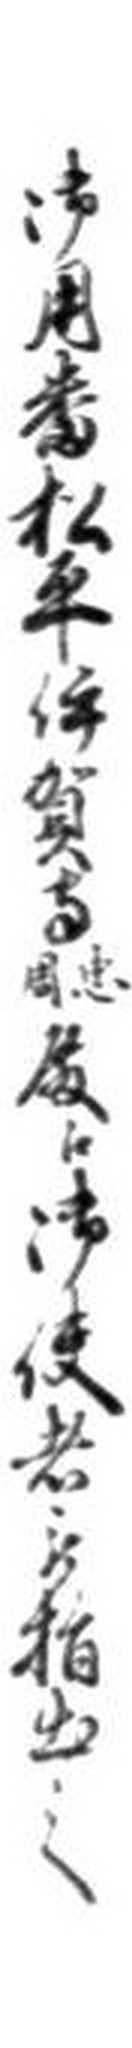御用番松平伊賀守忠周殿江御使者被指出之
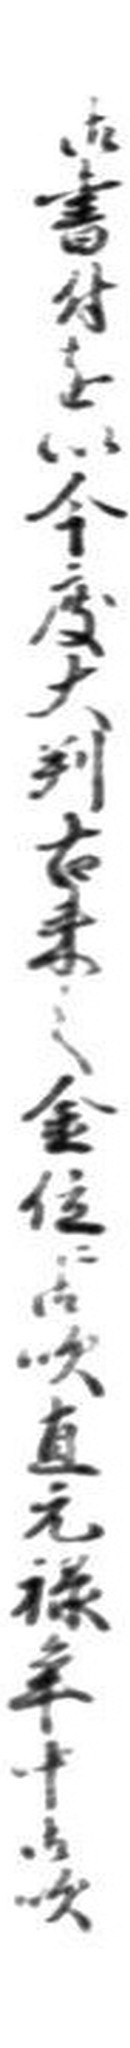御書付を以今度大判古来之金位に御吹直元禄年中御吹
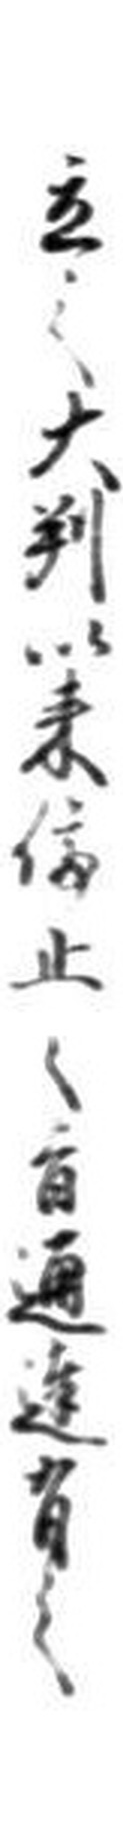立之大判以来停止之旨通達有之
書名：家譜 三十九 宗矩公 享保十年
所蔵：福井県文書館 Fukui Prefectural Archives
